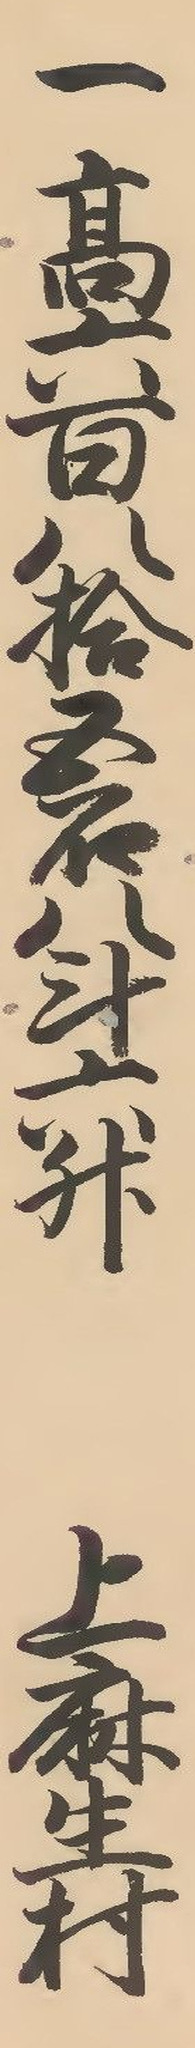一高六百八拾五石八斗六升上麻生村

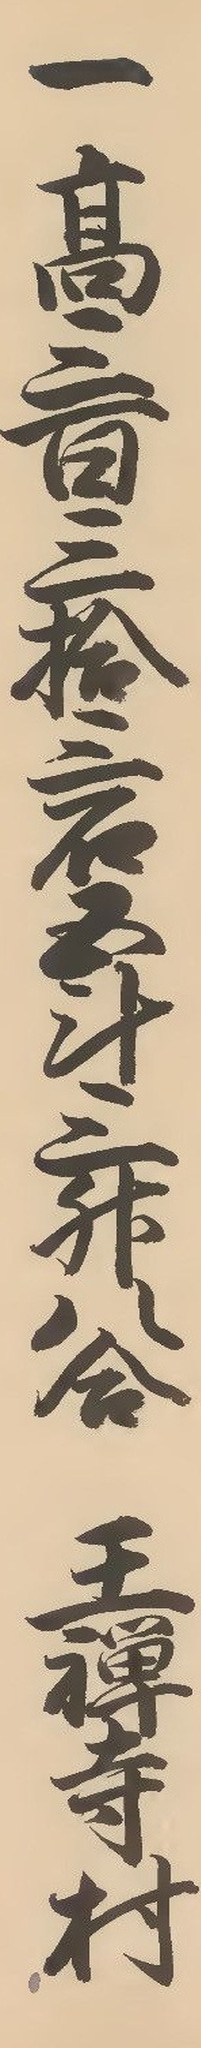一高三百三拾三石五斗三升八合王禅寺村
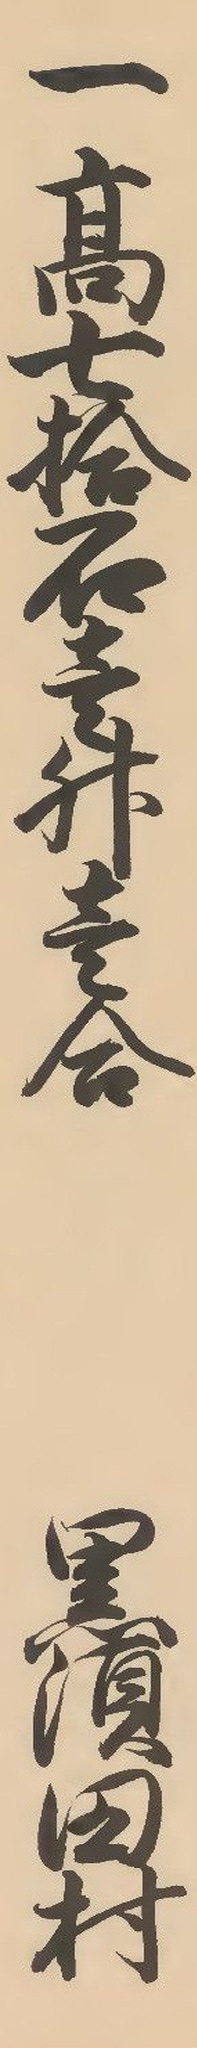一高七拾石壱升壱合黒須田村
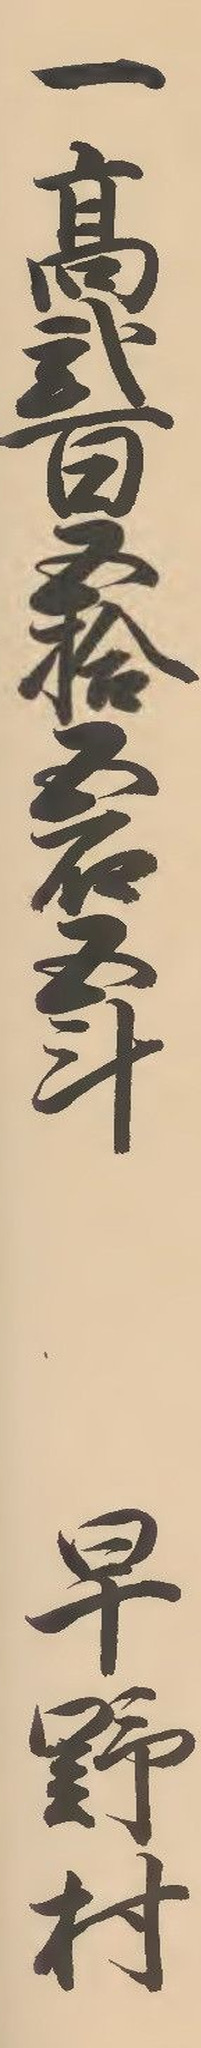一高弐百五拾五石五斗早野村
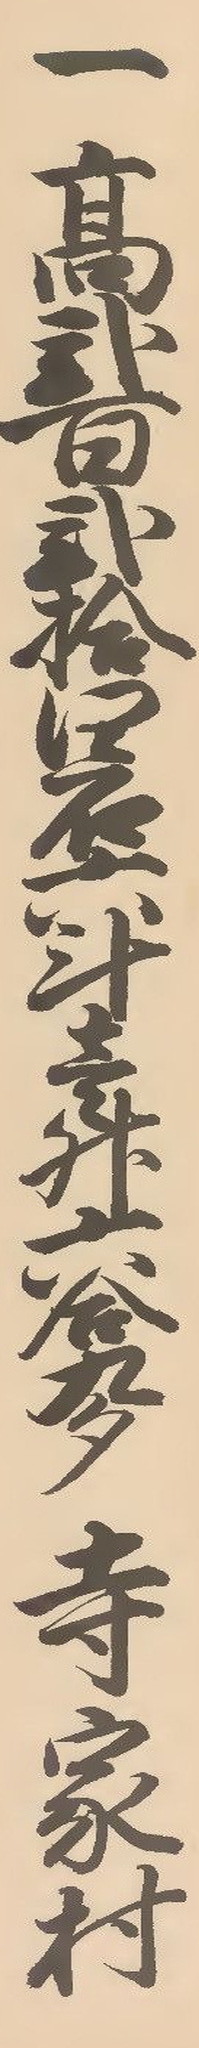一高弐百弐拾四石六斗壱升六合九勺寺家村
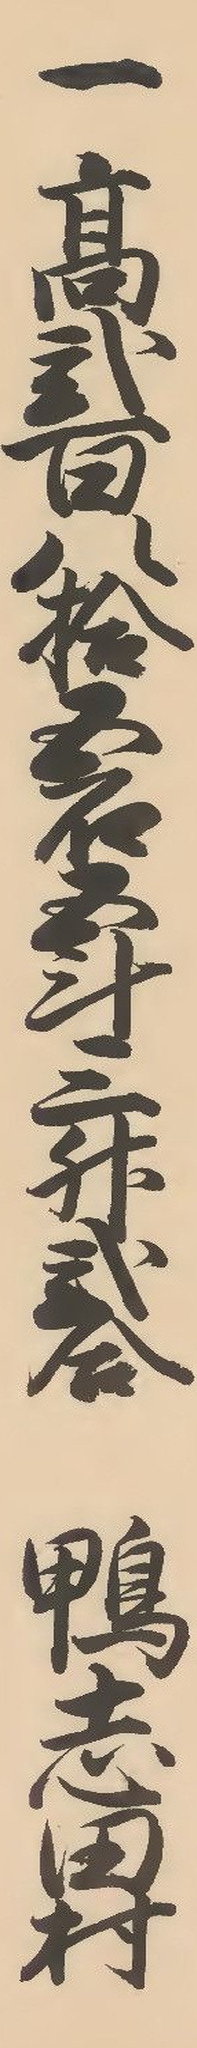一高弐百八拾五石五斗三升弐合鴨志田村
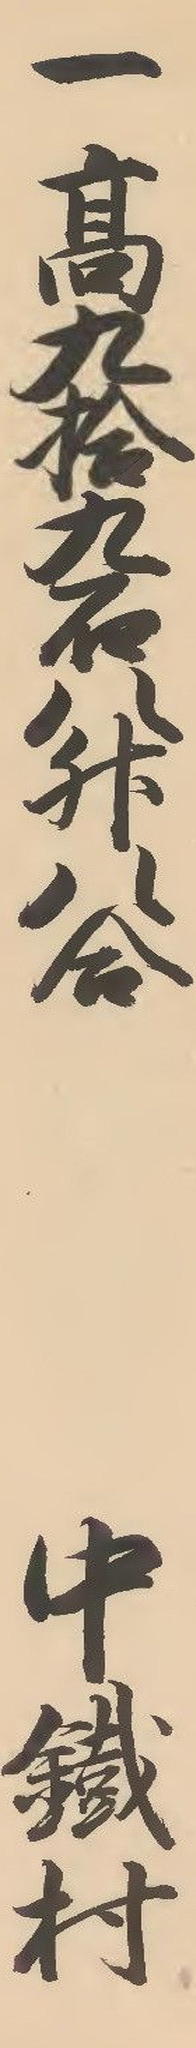一高九拾九石八升八合中鉄村
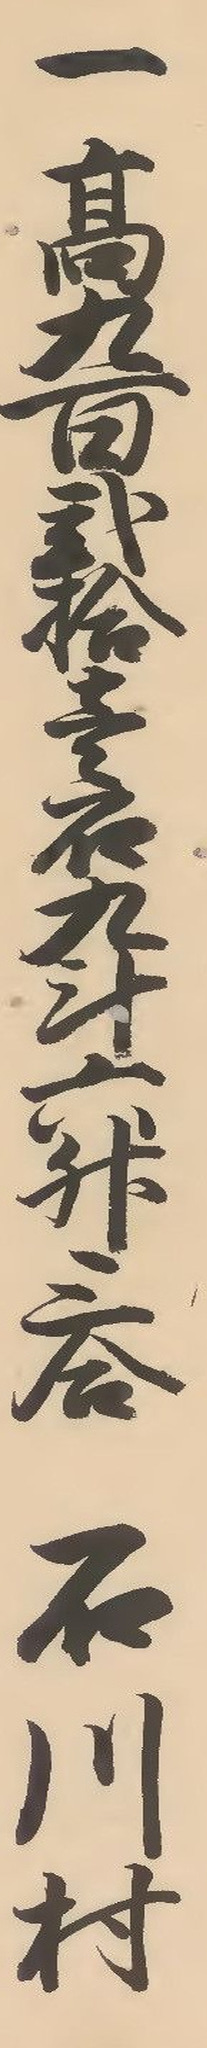一高九百弐拾壱石九斗六升三合石川村

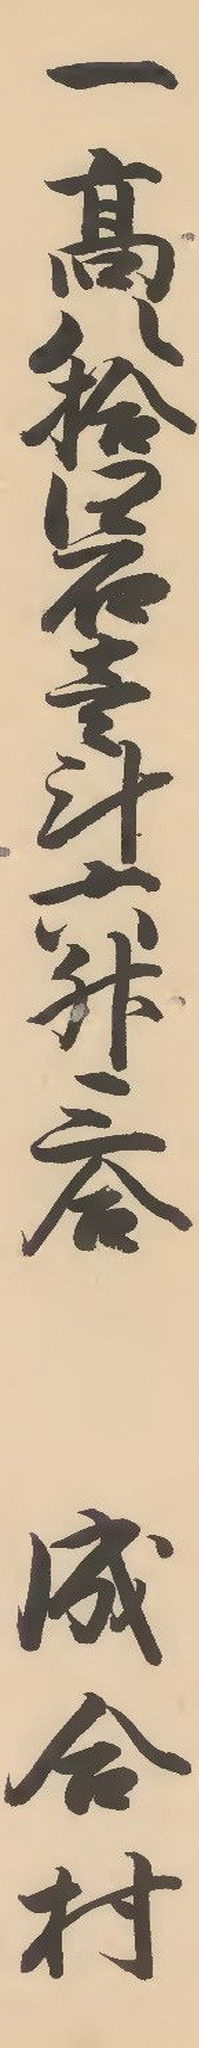一高八拾四石壱斗六升三合成合村
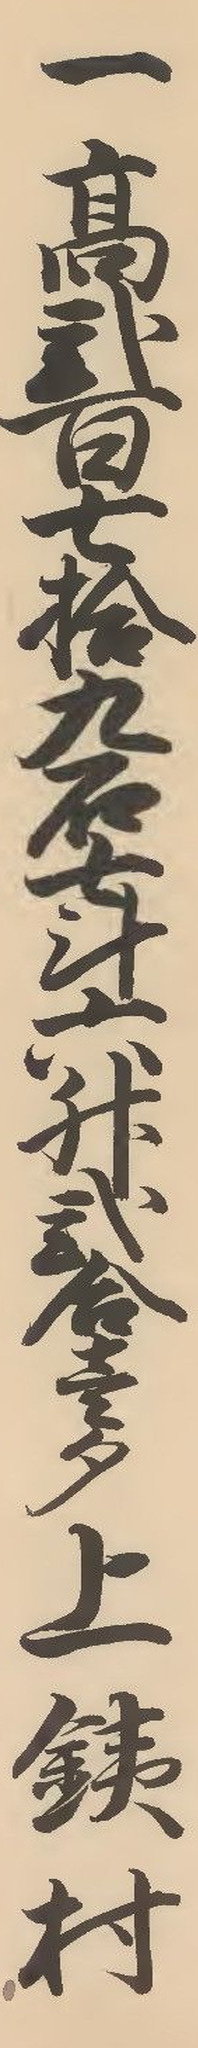一高弐百七拾九石七斗六升弐合壱勺上鉄村
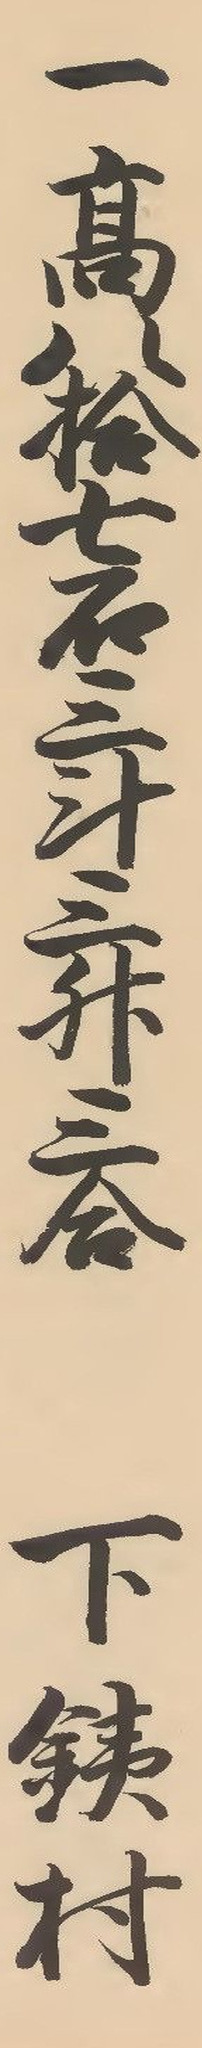一高八拾七石三斗三升三合下鉄村
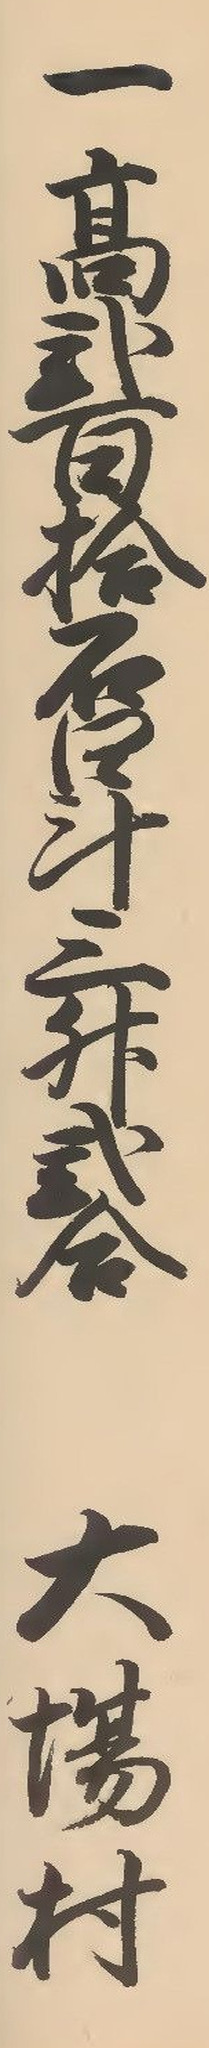一高弐百拾石四斗三升弐合大場村
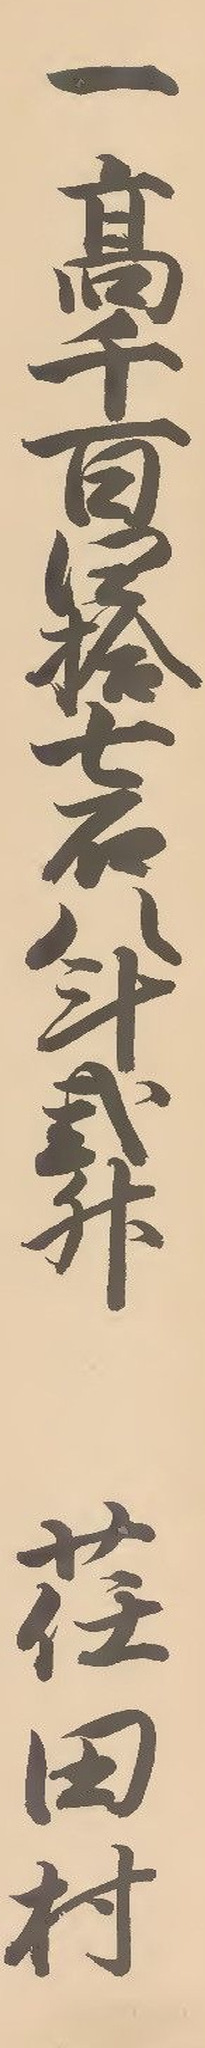一高千百四拾七石八斗弐升荏田村
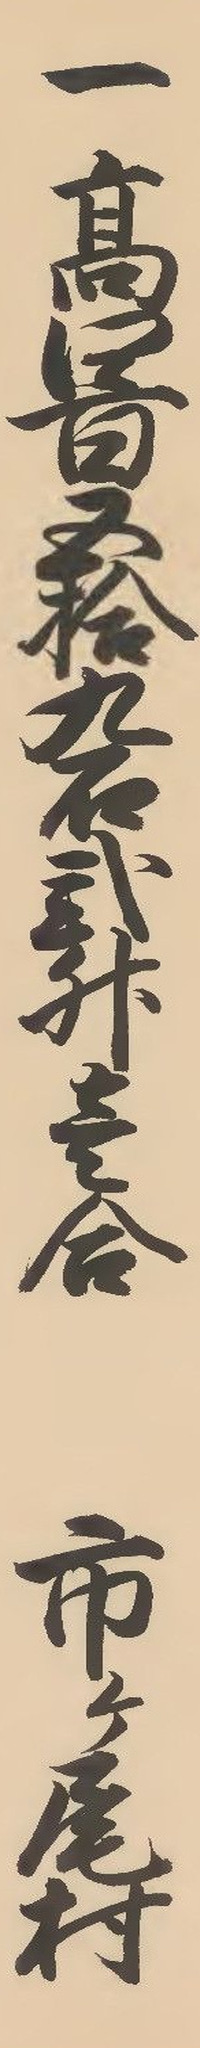一高四百五拾九石弐升壱合市ヶ尾村
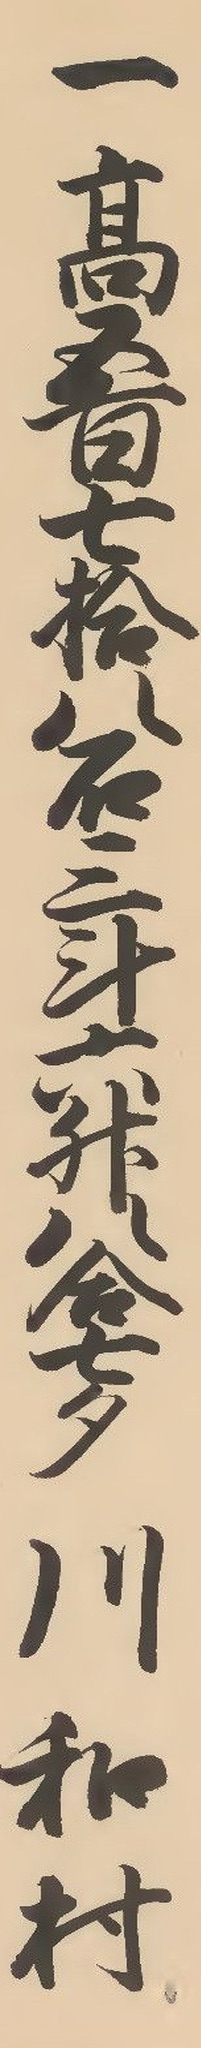一高五百七拾八石三斗六升八合七勺川和村
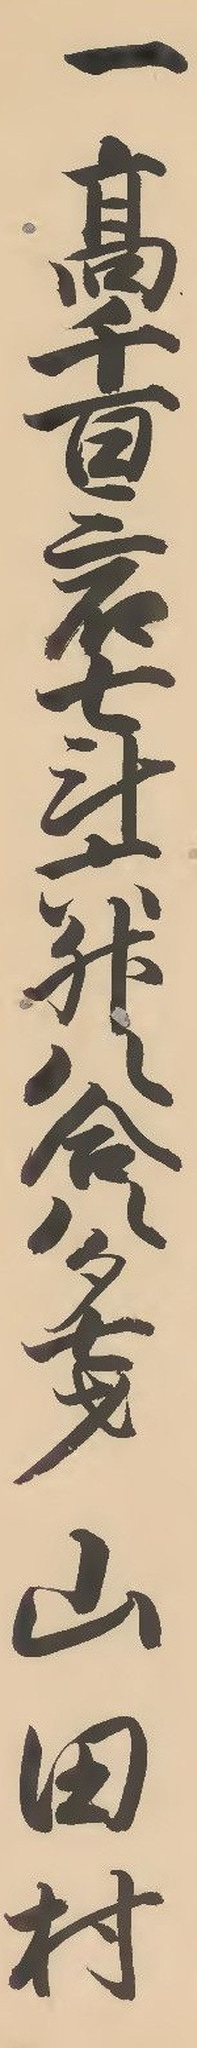一高千百三石七斗六升八合八勺七才山田村
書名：武蔵国郷帳　上
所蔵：国立公文書館 National Archives of Japan
